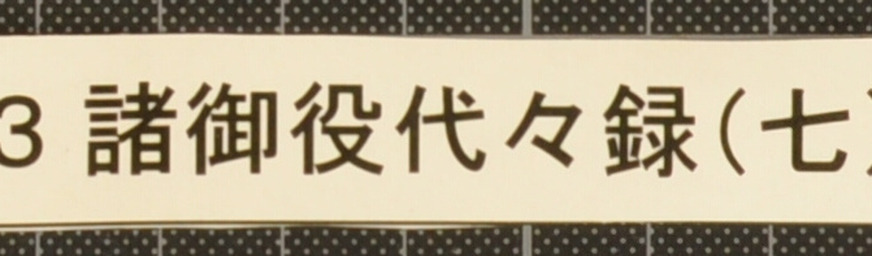諸御役代々録七
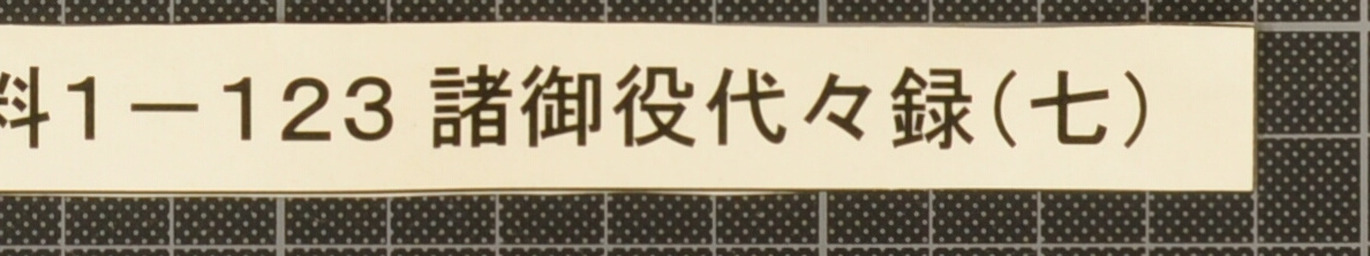諸御役代々録七
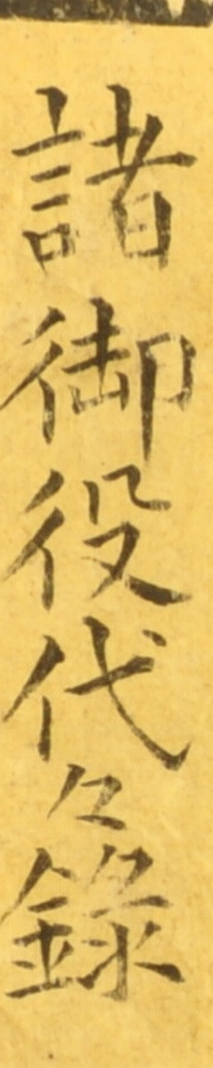諸御役代々録七

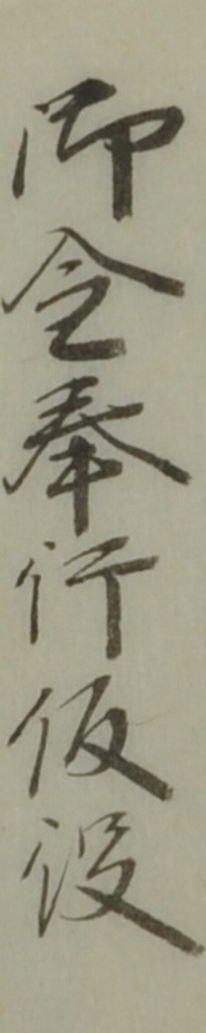御金奉行仮役
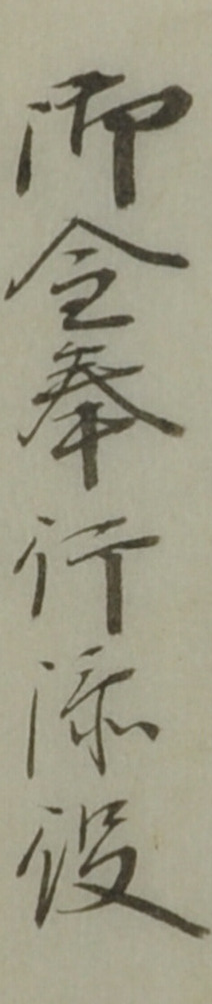御金奉行添役
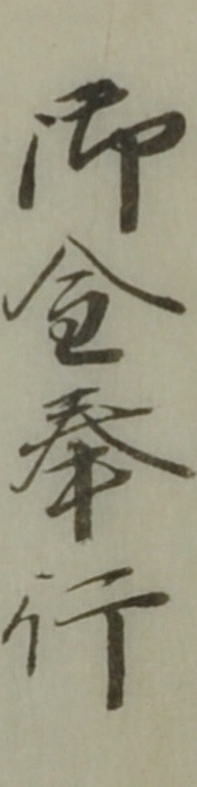御金奉行
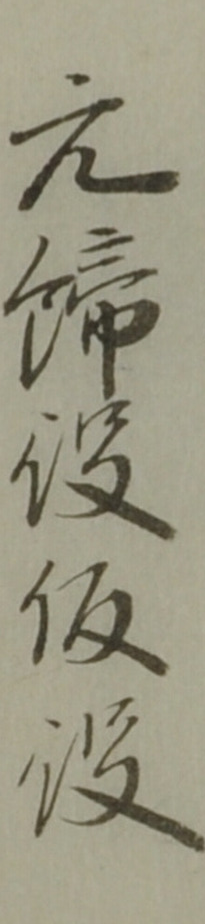元締役仮役
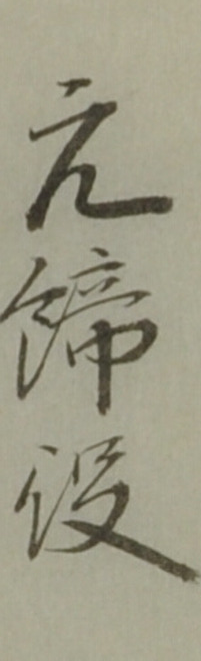元締役
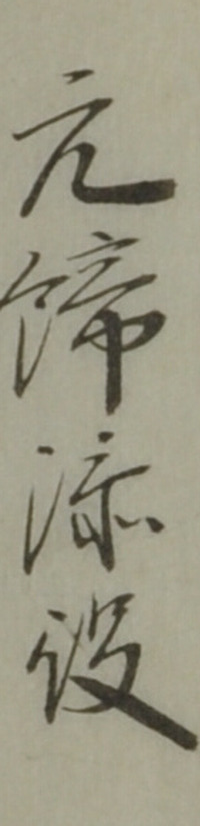元締添役
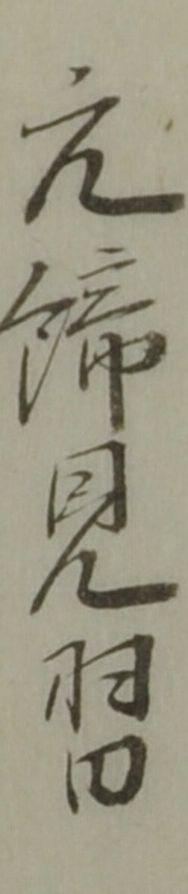元締見習
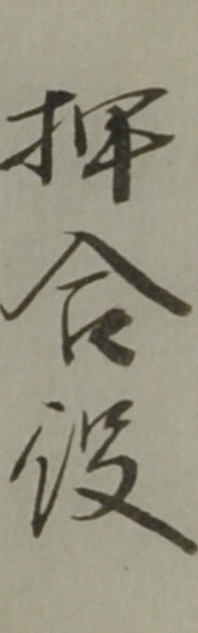押合役
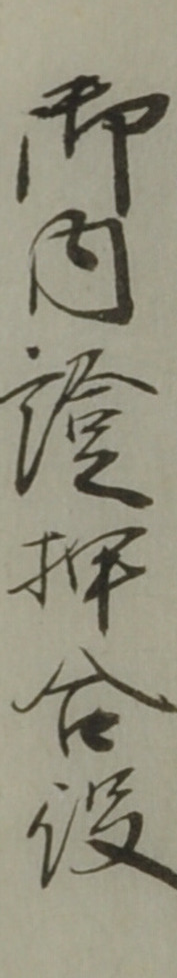御内省証押合役
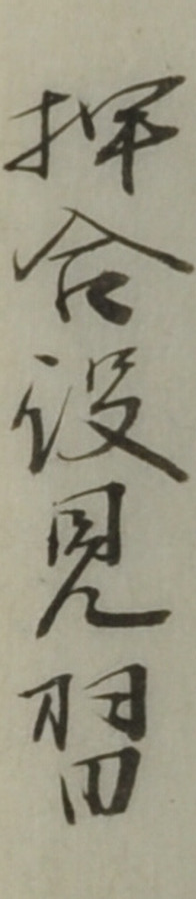押合役見習

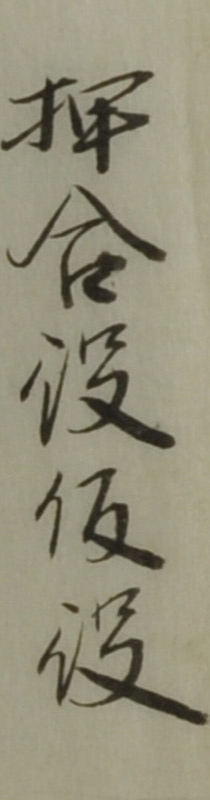押合役仮役
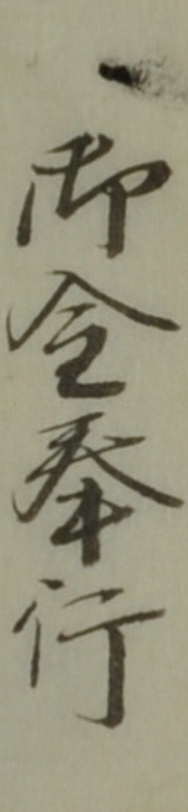御金奉行
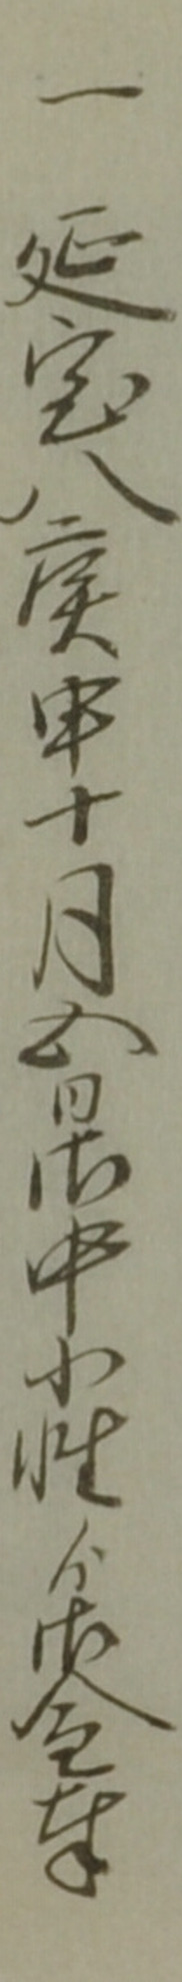一延宝八庚申十月五日御中小性ゟ御金奉
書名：諸御役代々録（七）
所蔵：伊那市立高遠町図書館・合同会社AMANE
